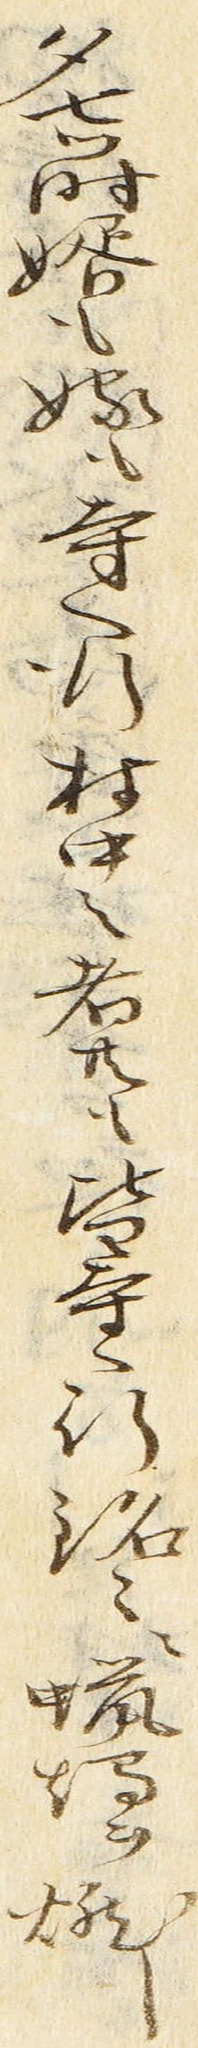夕七ツ時婿も嫁も寺へ行村中之者共皆寺へ行銘銘首に蝋燭ヲ燃し
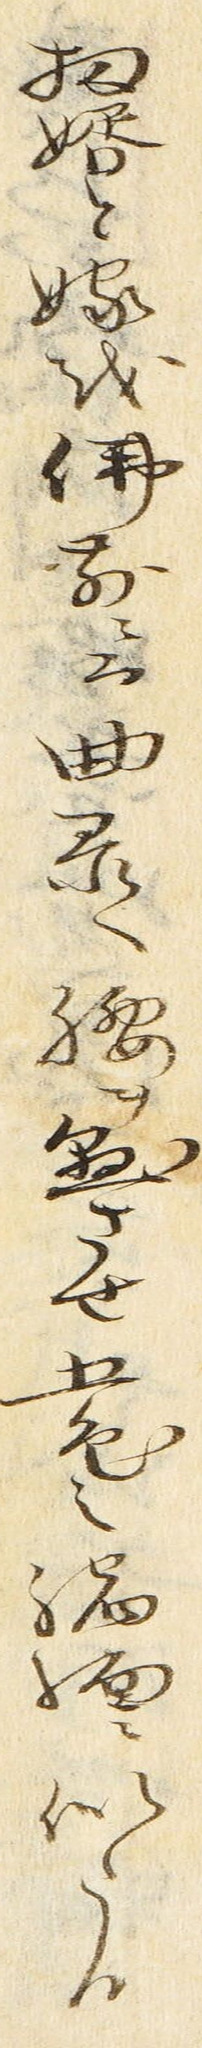扨婿と嫁を仏前に而曲彔へ腰を懸させ五色之編緬に似たる
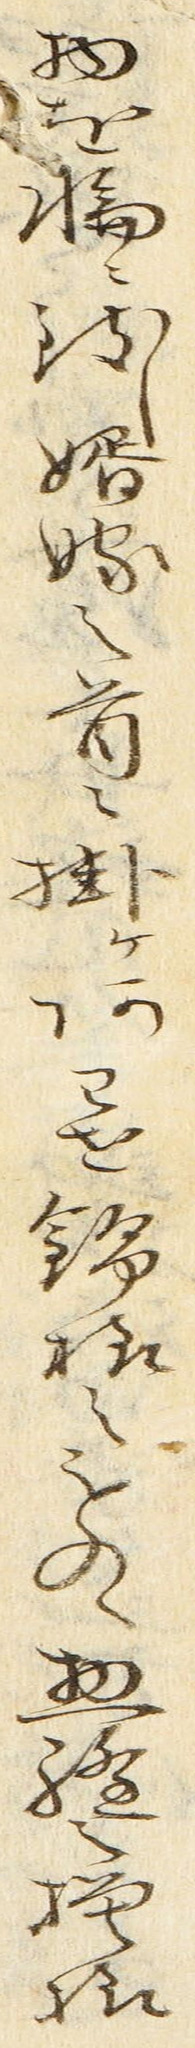掛けあ物を輪に致し婿嫁之首に掛けあわせ錦様之ものの惣縫之模様
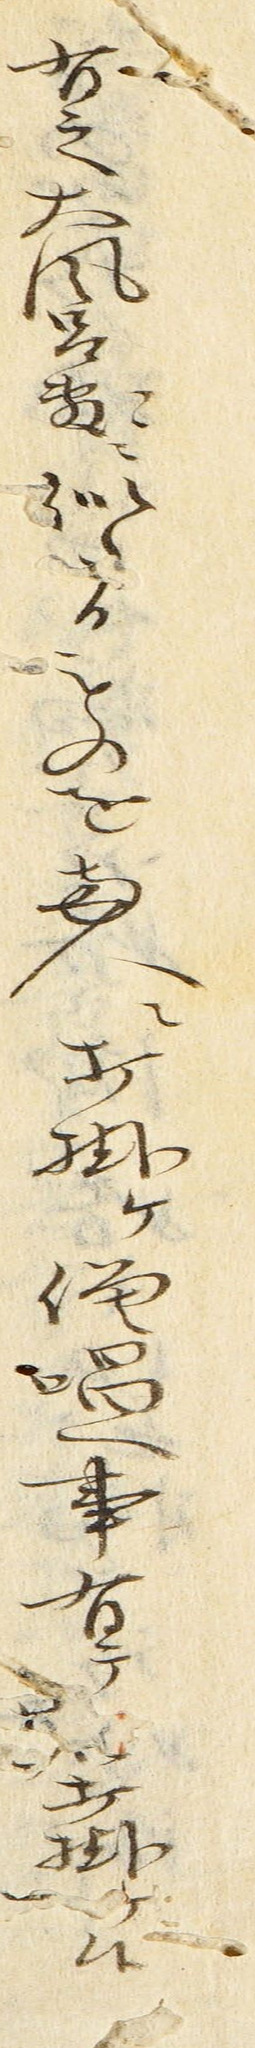有之大風呂敷に似たるものを両人に打掛け僧唱へ事有テ？打掛ケ候

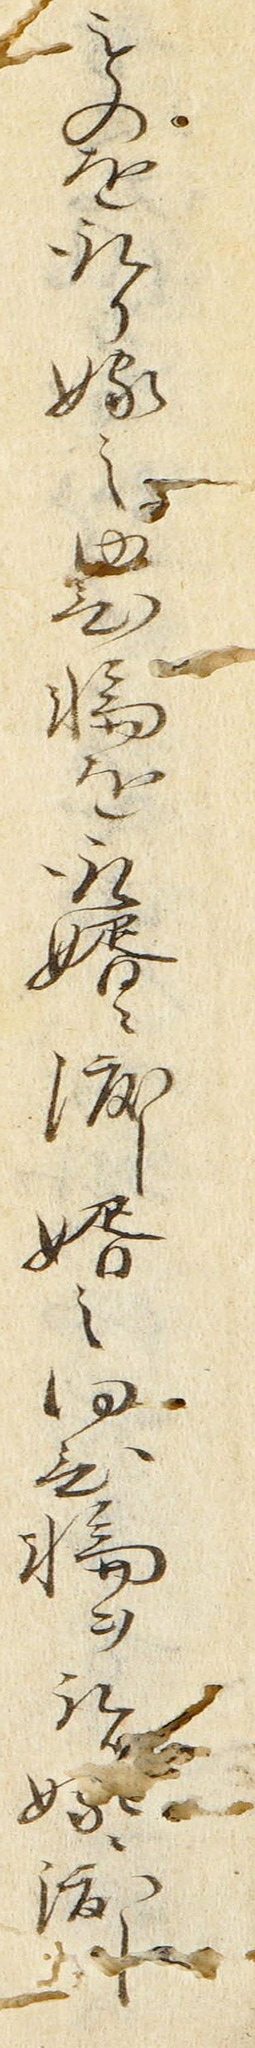ものを取り嫁之ゆひ輪を取婿に渡し婿之ゆひ輪ヲ取り嫁に渡し
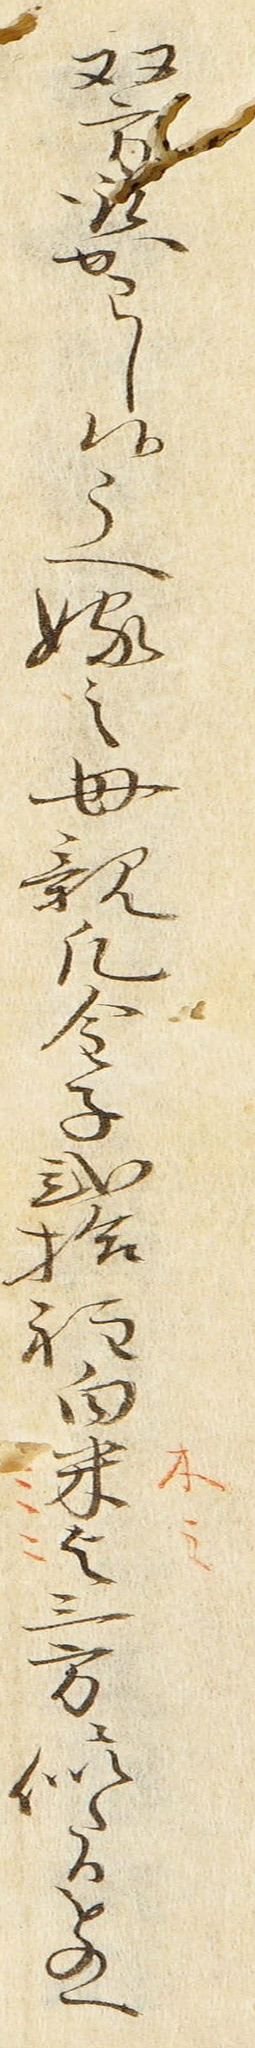双方取かわし候うへ嫁の母親凡金子弐拾程白米と三方に似たるものへ
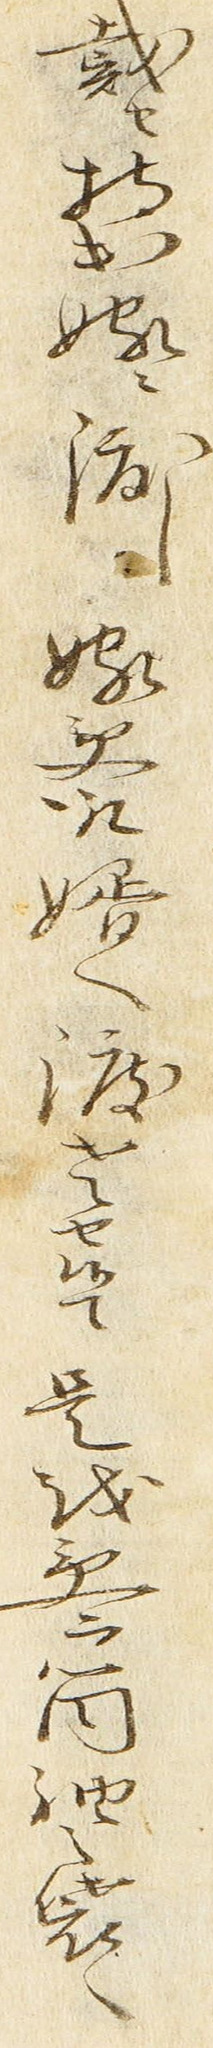載せ持出嫁に渡し嫁受取へ渡させ候て是を受而筒袖の装へ
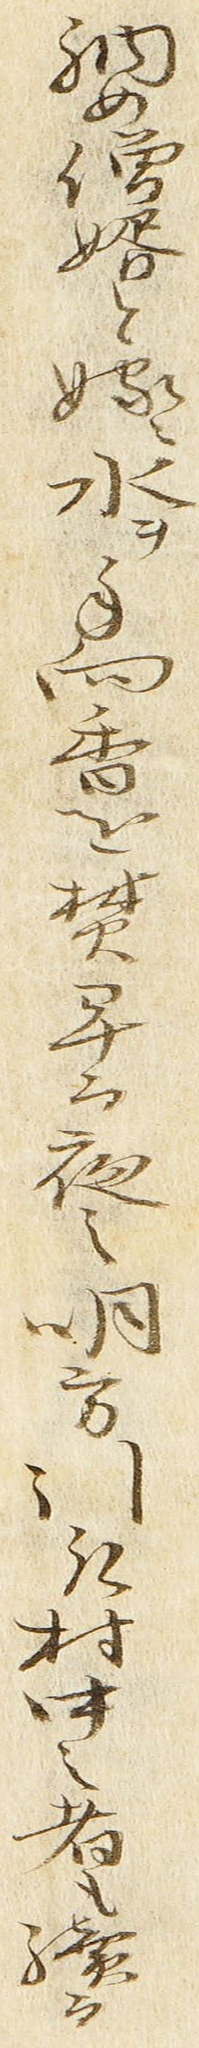納め僧婿と嫁に水を手向香を焚早而夜之明方引き取村中之者も続々
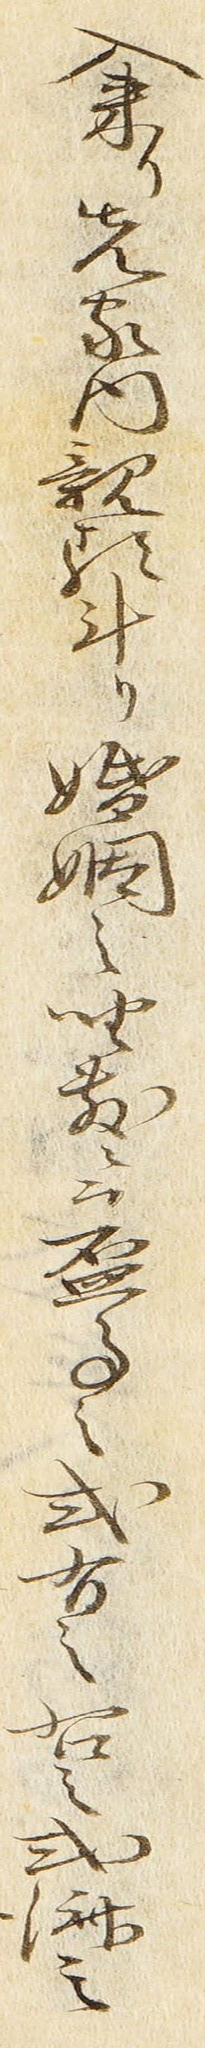入来り先家内親類斗り婚姻の坐敷に而盃事之式有之右之式済之
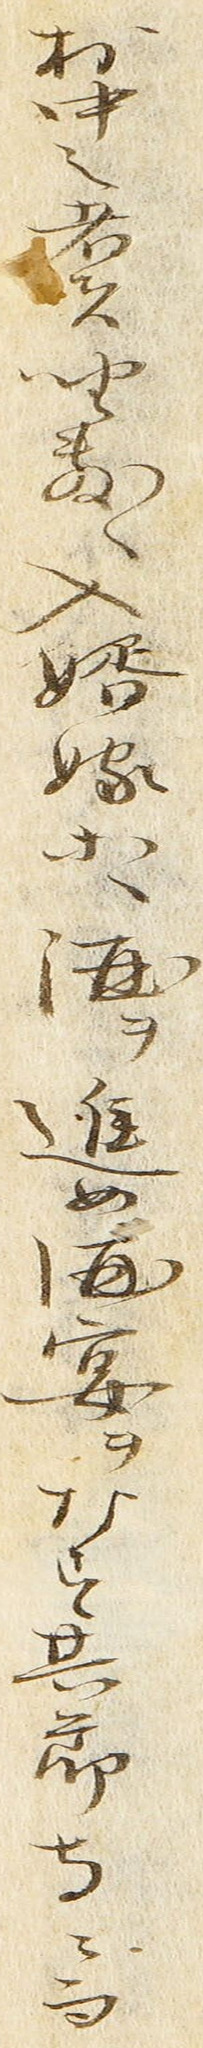村中之者共坐敷へ入婿嫁等へ酒ヲ進め酒宴ヲなす其節寺に而
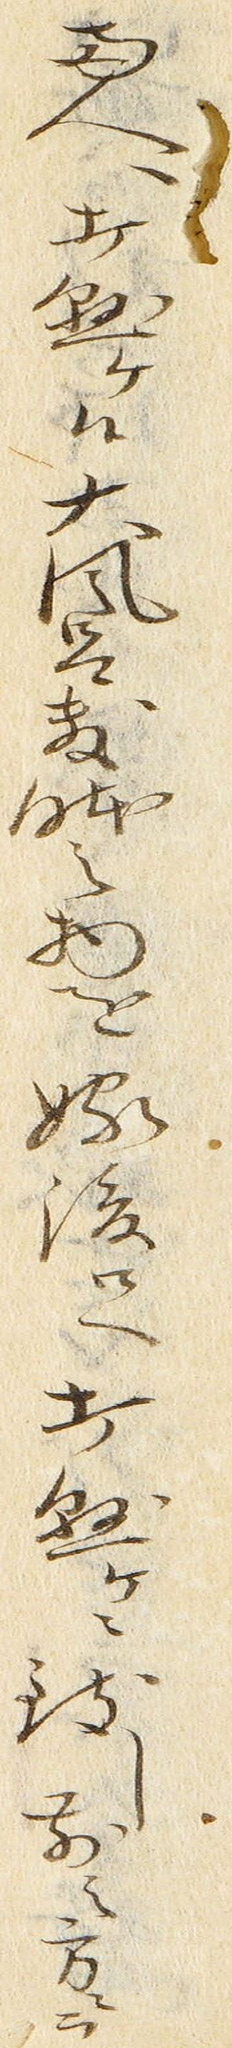両人へ打懸ケ候大風呂敷躰之物を嫁後ろへ打懸ケに致し前之方に而
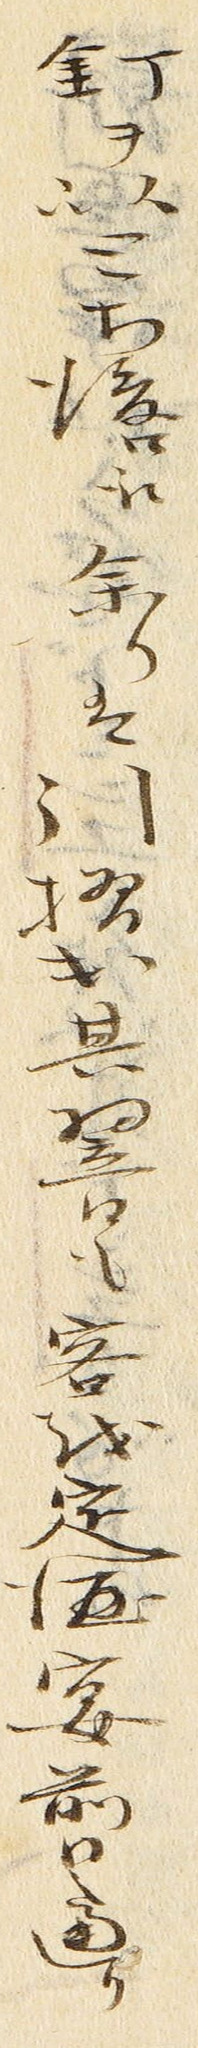釘ヲ以とち後ろ江余りは引掲け其翌日も客を定酒宴前日之通り
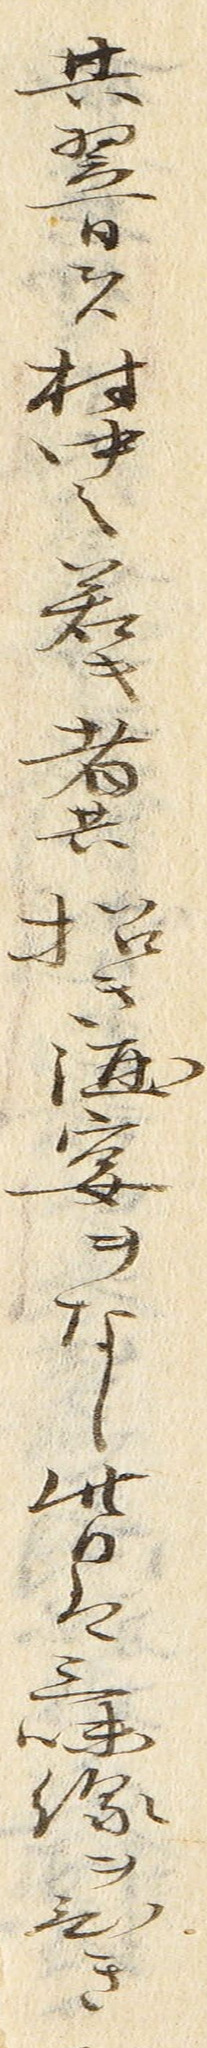其翌日は村中之若き者共招き酒宴ヲなし此日は三味線ヲひき
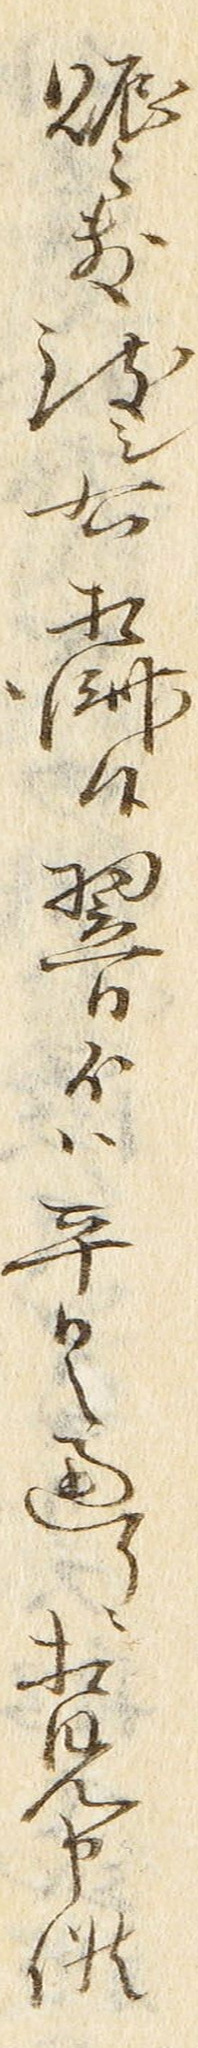賑々敷致し右相済候翌日ゟは平日之通りに相見申候
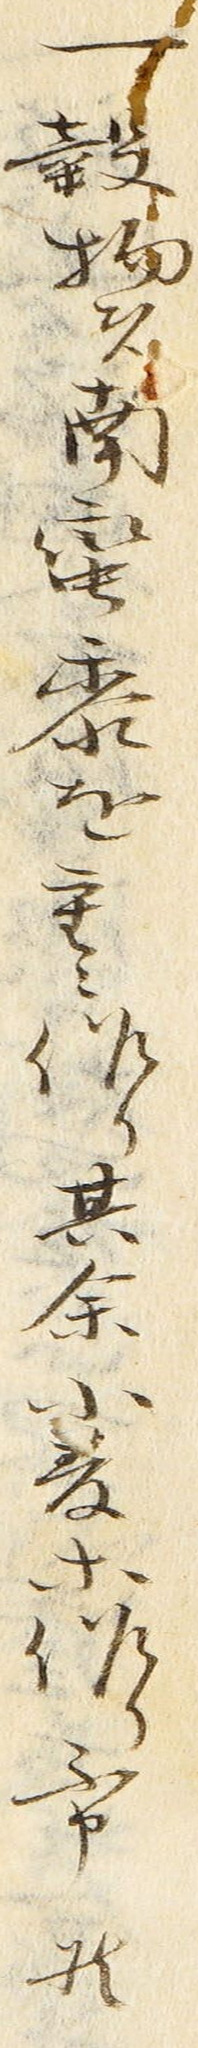一穀物は南蛮黍を重に作り其余小麦等作り不申候
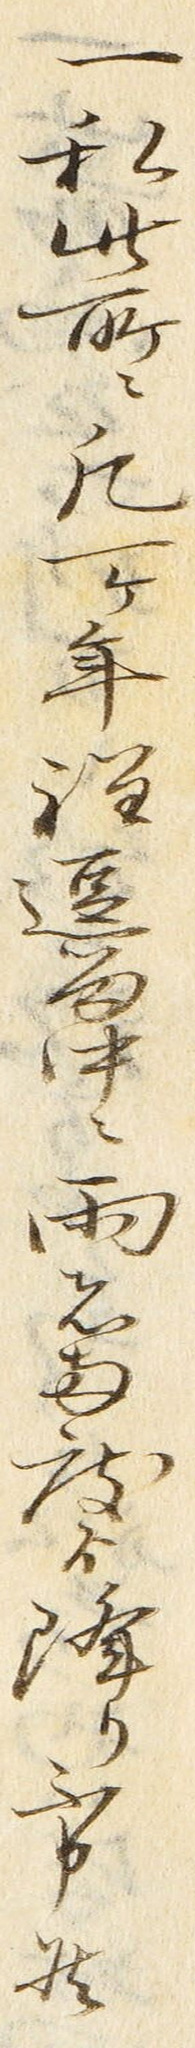一私此所に凡一ケ年程逗留中に雨は両度ゟ降り不申候
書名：漂流人弥市之記
